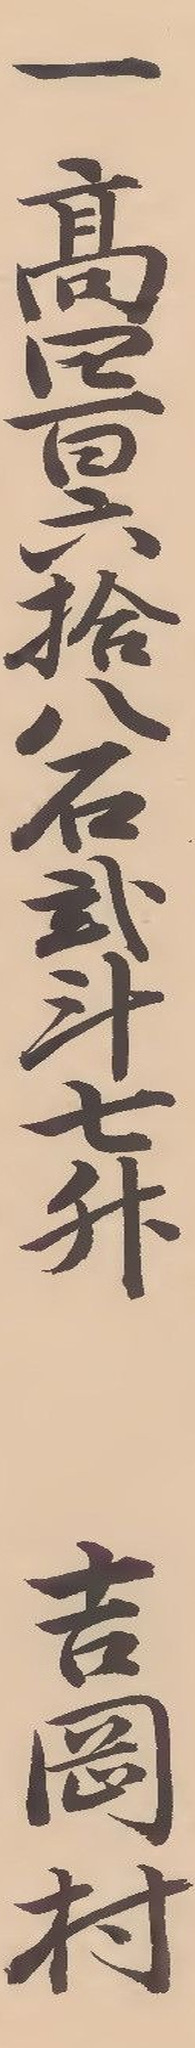一高四百六拾八石弐斗七升吉岡村
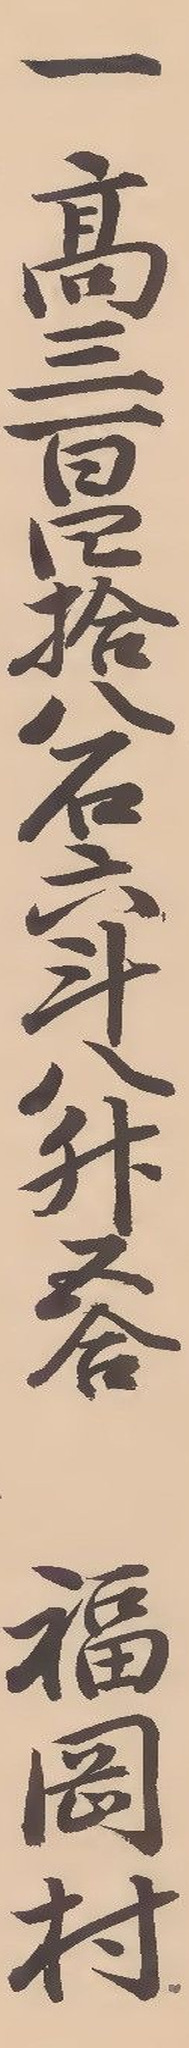一高三百四拾八石六斗八升五合福岡村
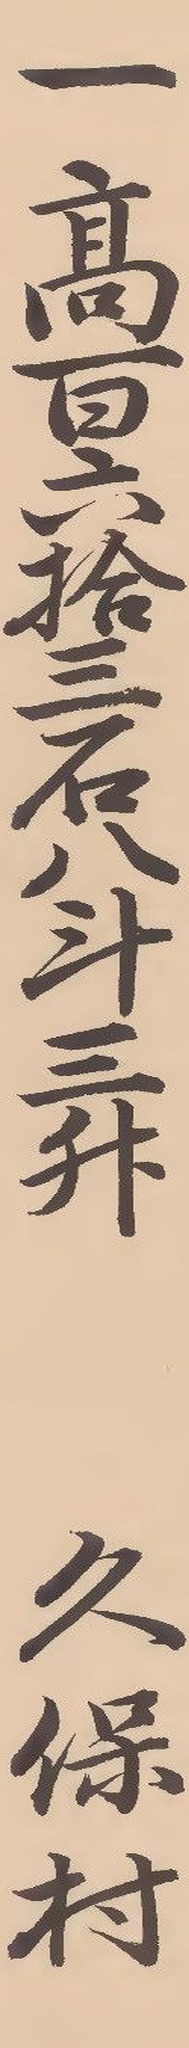一高百六拾三石八斗三升久保村
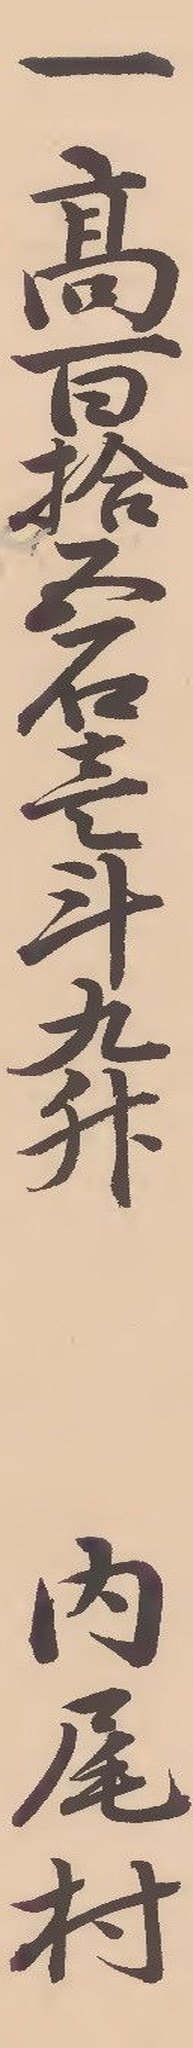一高百拾五石壱斗九升内尾村

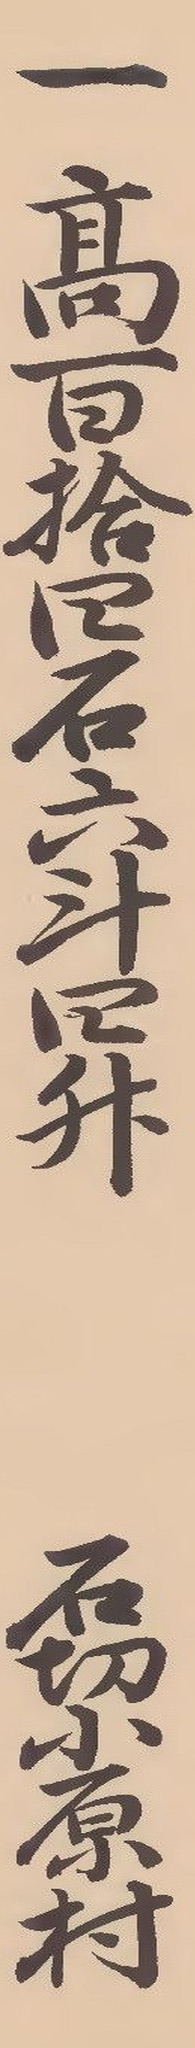一高百拾四石六斗四升石切小原村
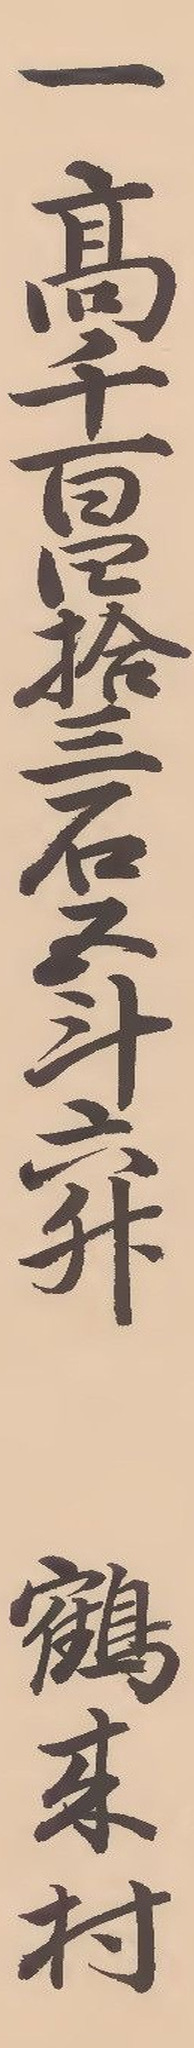一高千百四拾三石五斗六升鶴来村

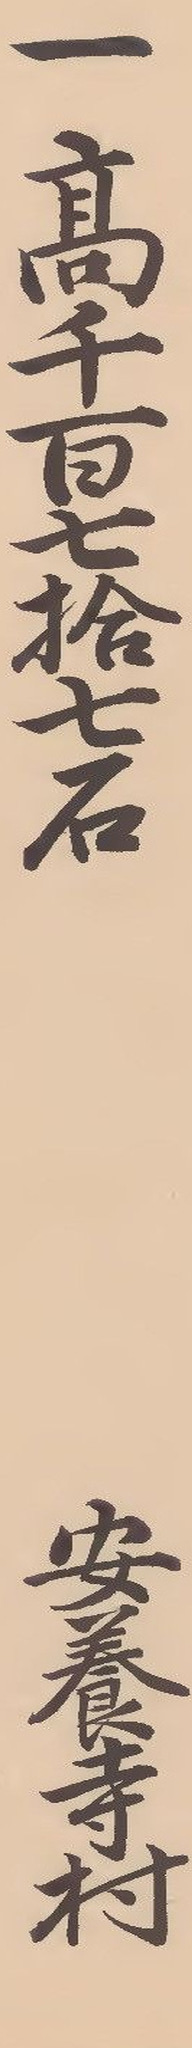一高千百七拾七石安養寺村
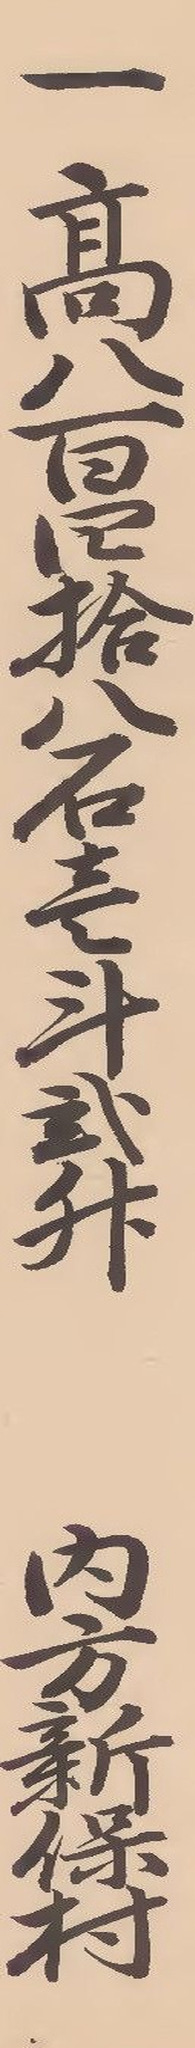一高八百四拾八石壱斗弐升内方新保村
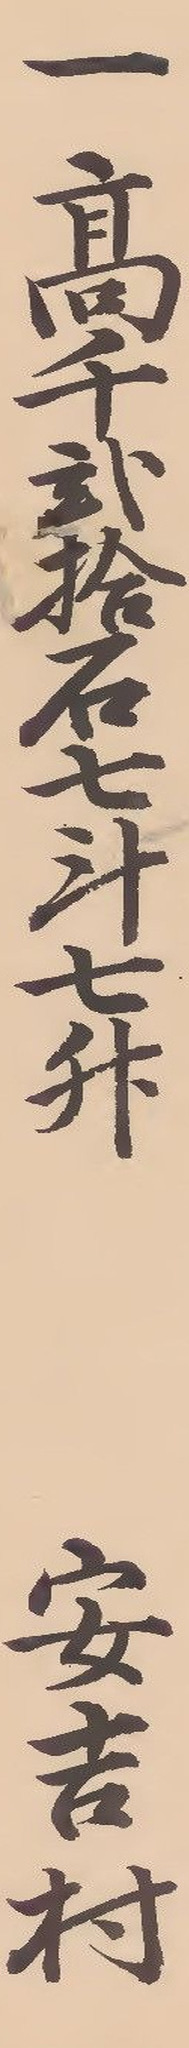一高千弐拾石七斗七升安吉村

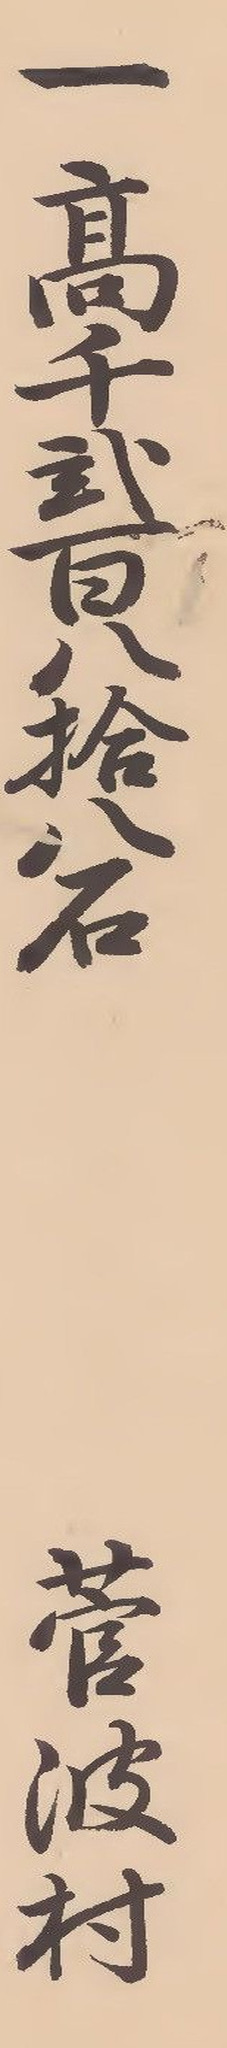一高千弐百八拾八石菅波村
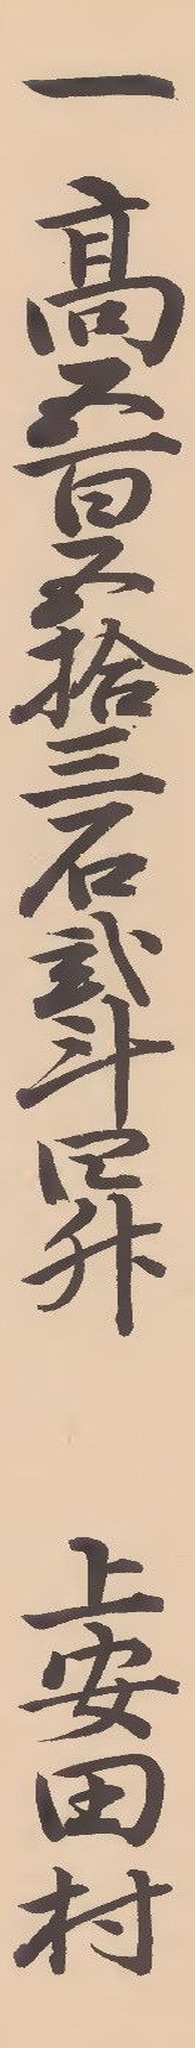一高五百五拾三石弐斗四升上安田村
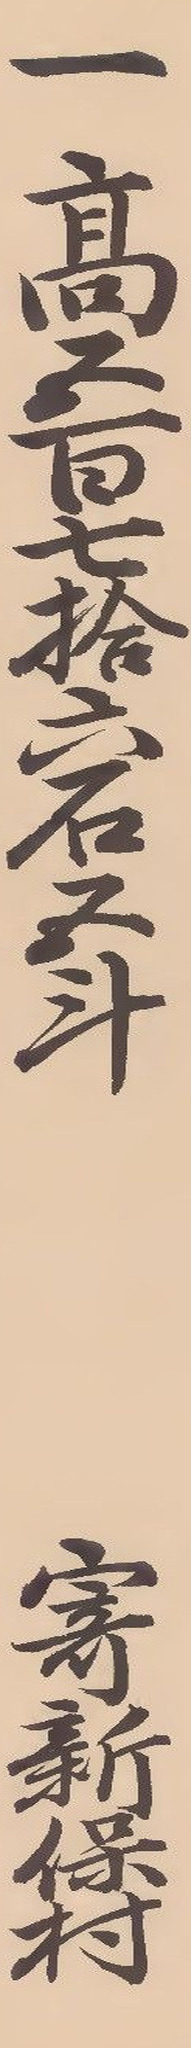一高五百七拾六石五斗寄新保村
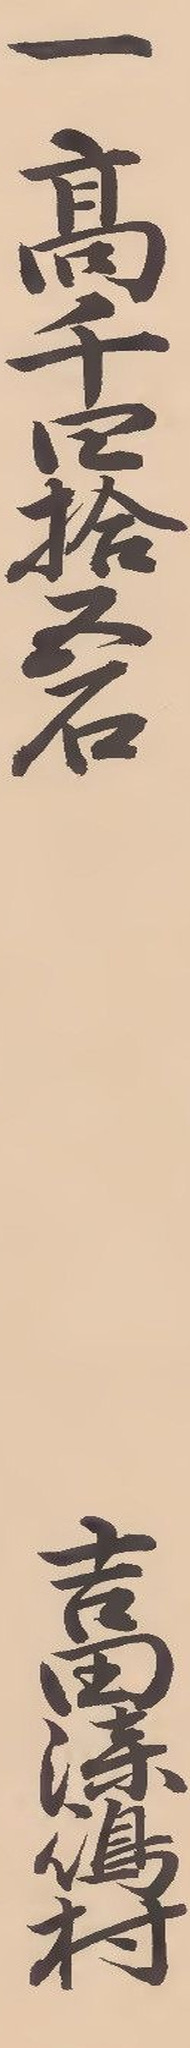一高千四拾五石吉田漆島村
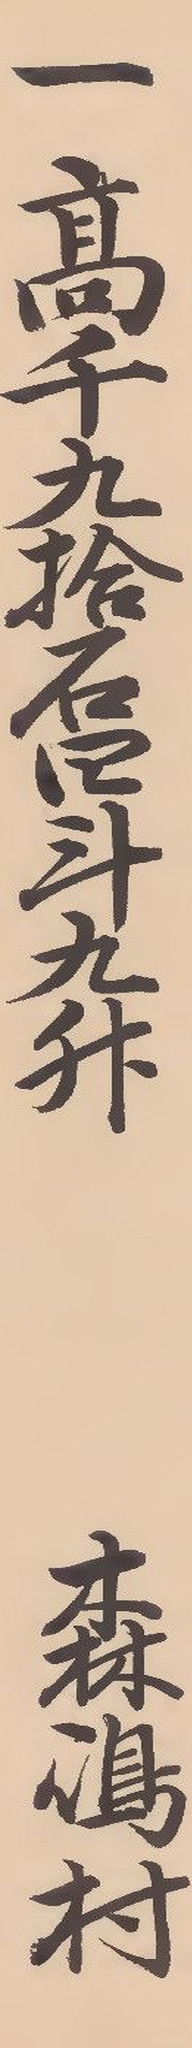一高千九拾石四斗九升森島村
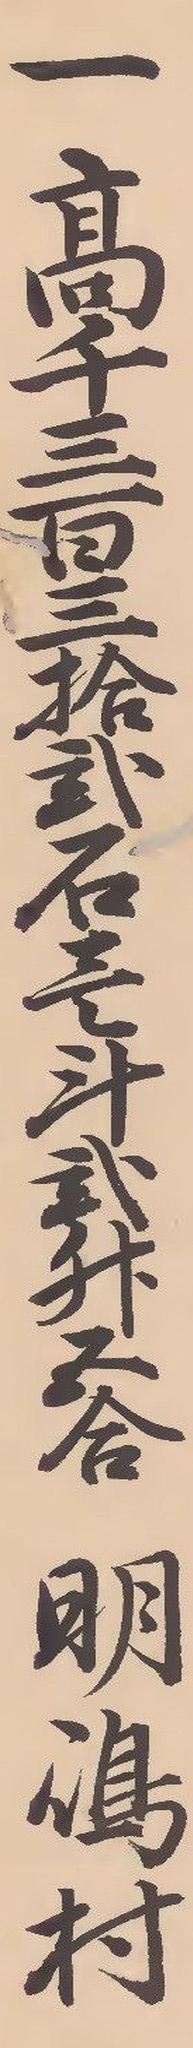一高千三百三拾弐石壱斗弐升五合明島村

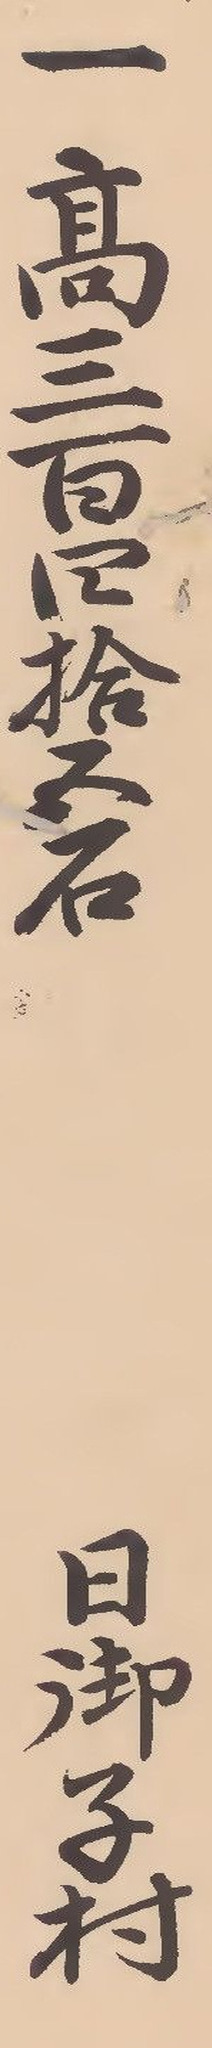一高三百四拾五石日御子村
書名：加賀国郷帳
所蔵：国立公文書館 National Archives of Japan
